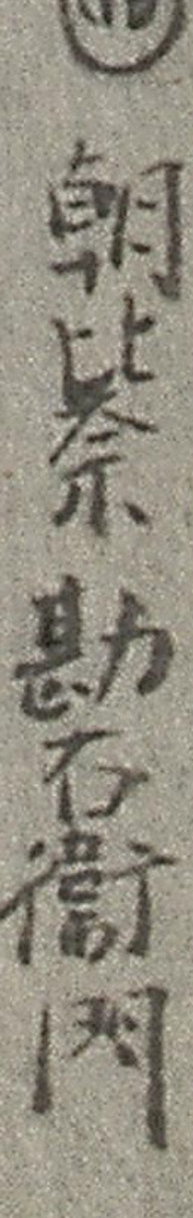朝比奈勘右衛門
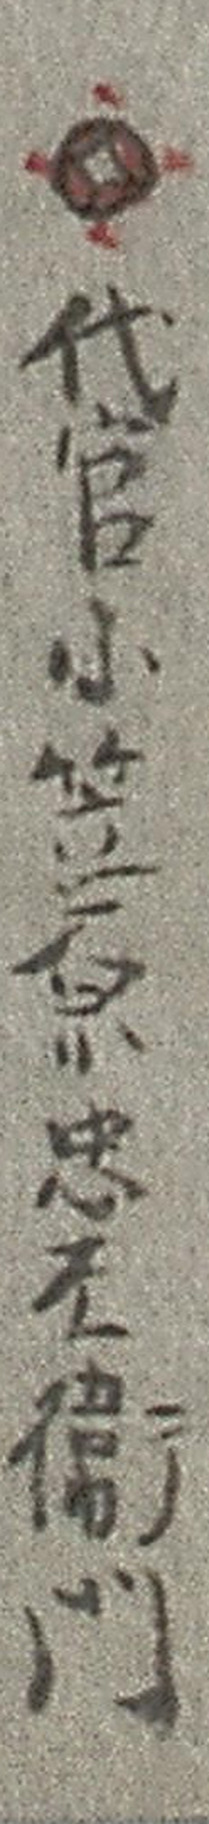代官小笠原忠左衛門
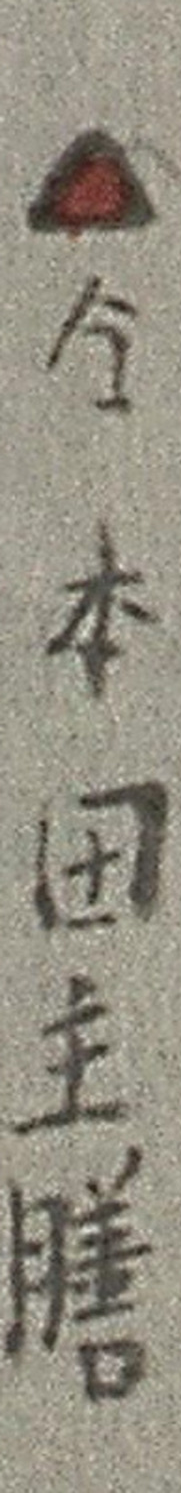同本田主膳
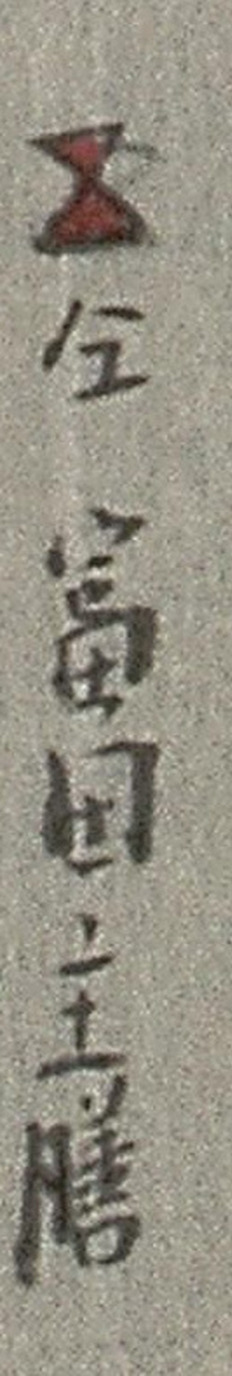同富田主膳
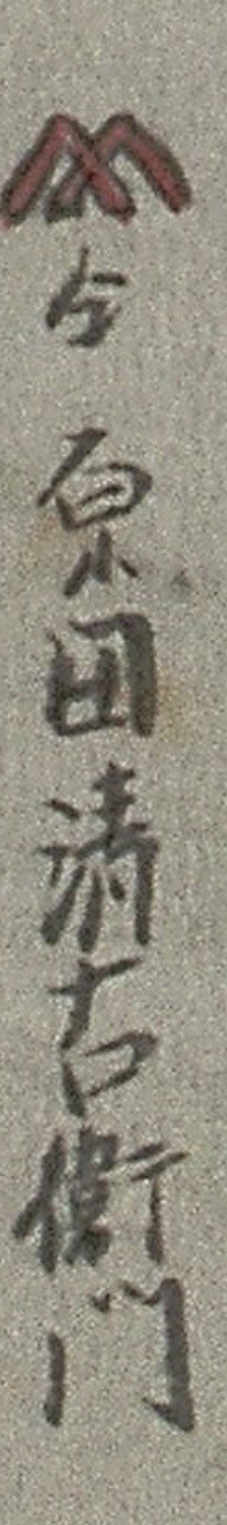同原田清右衛門
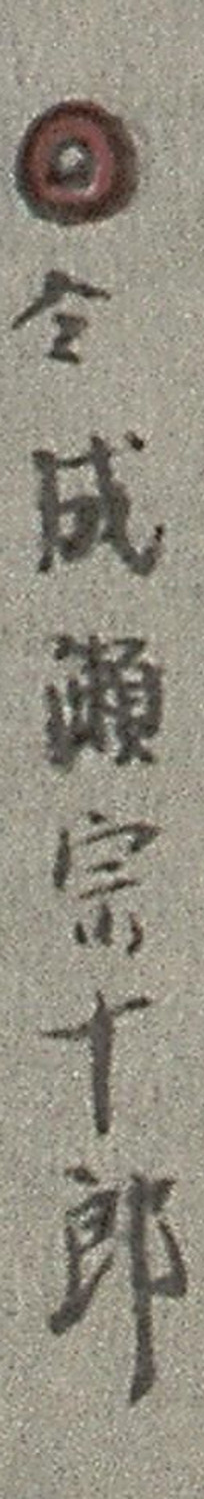同成瀬宗十郎
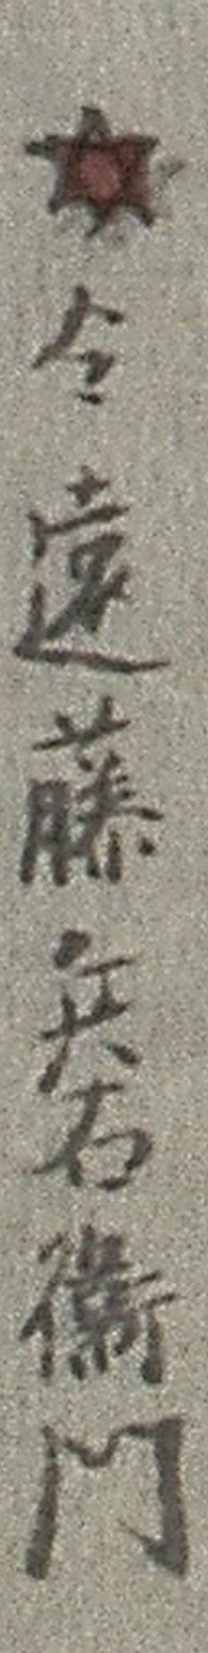同遠藤兵右衛門
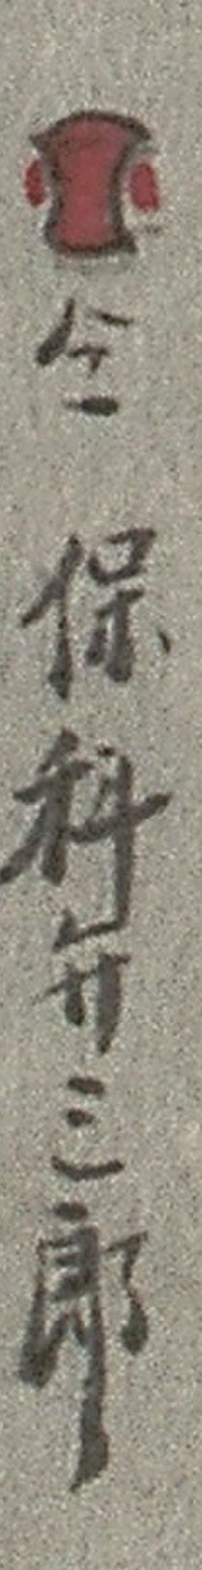同保科弁三郎
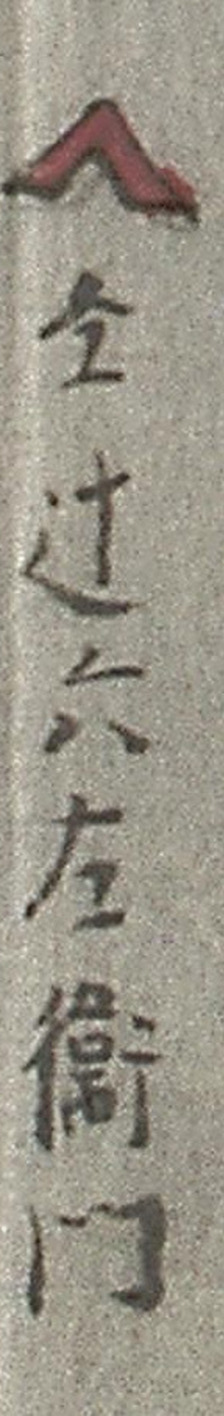同辻六左衛門
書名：天明三年癸卯六月　沙降記　［蕗原拾続巻之五十二］
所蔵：東京大学地震研究所図書室 Earthquake Research Institute Library, The University of Tokyo, JAPAN
